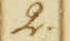2.
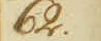62.
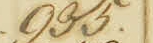935.
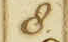8.
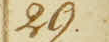29.
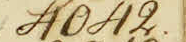4042.
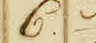6.
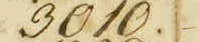3010.
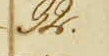32.
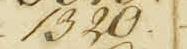1320.
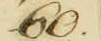60.
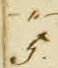5.
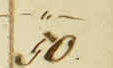50.
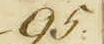95.
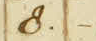8.
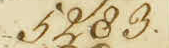5283.
